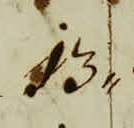13
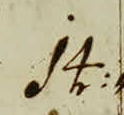14
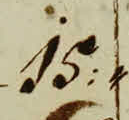15:
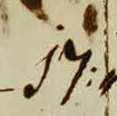17:
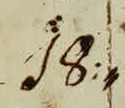18:
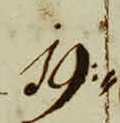19
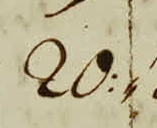20:
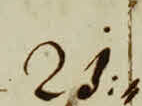21:
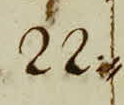22:
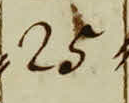25
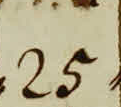25
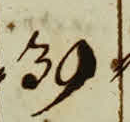39
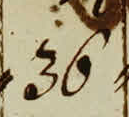36
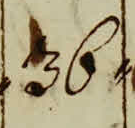36
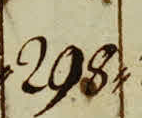298
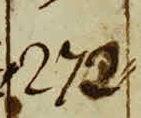272
